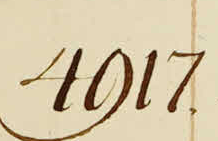4917.
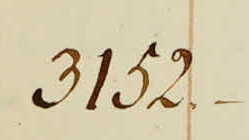3152.
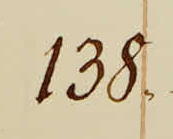138
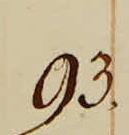93.
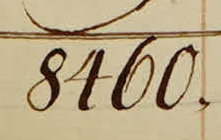8460
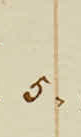5
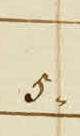5
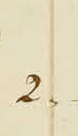2
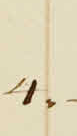4
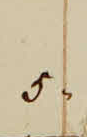5
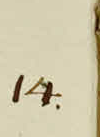14.
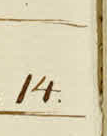14.
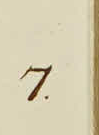7.
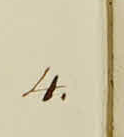4.
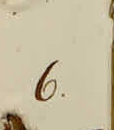6.
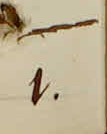1.
